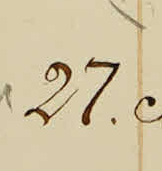27.
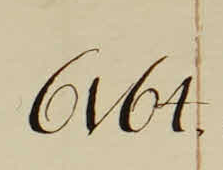6164
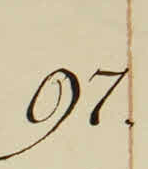97
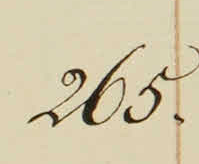265
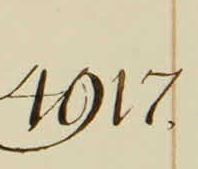4917
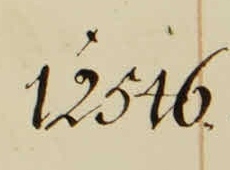12546.
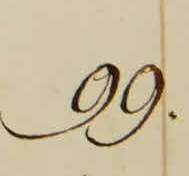99.
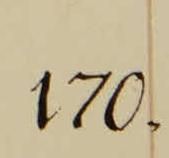170
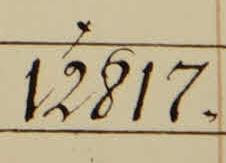12817
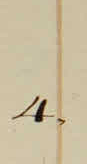4
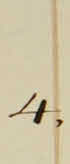4
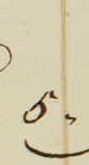5
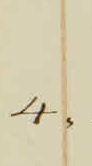4
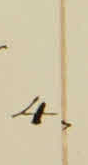4
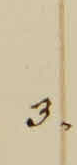3
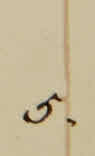5
